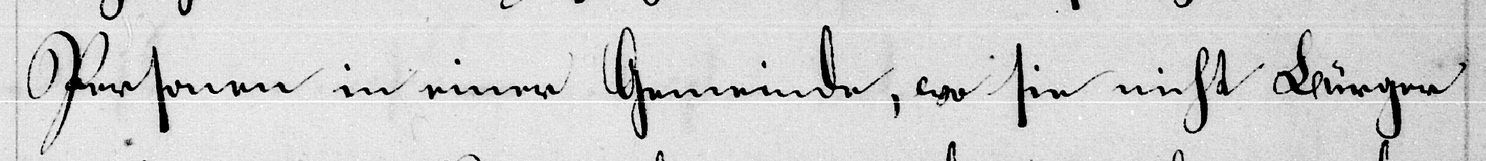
Personen in einer Gemeinde, wo sie nicht Bürger
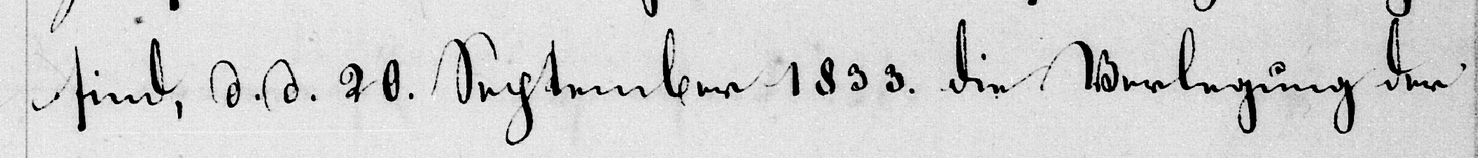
sind, d. d. 20. September 1833. die Verlegung der
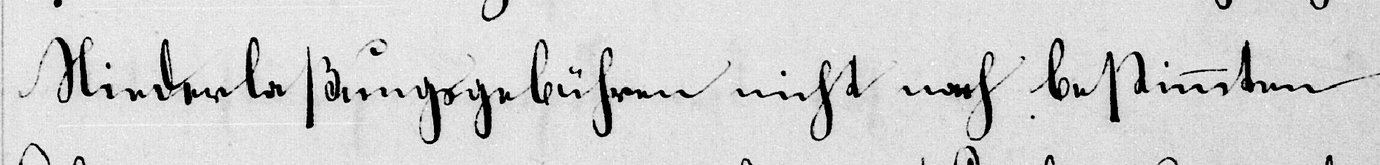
Niederlaßungsgebühren nicht nach bestimmten
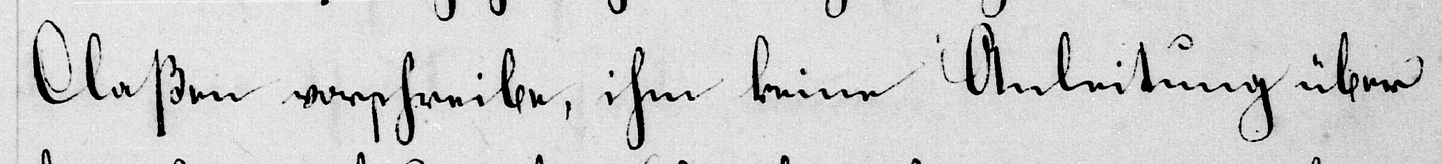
Claßen vorschreibe, ihm keine Anleitung über
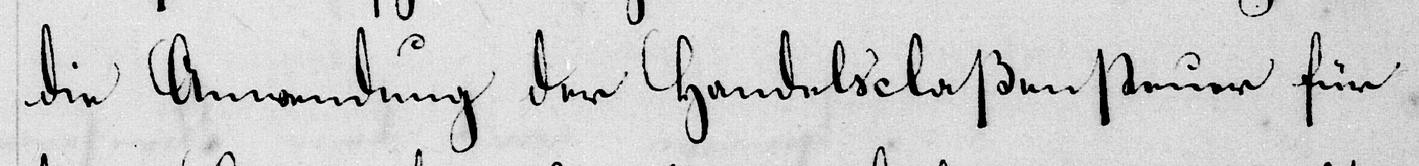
die Anwendung der Handelsclaßensteuer für
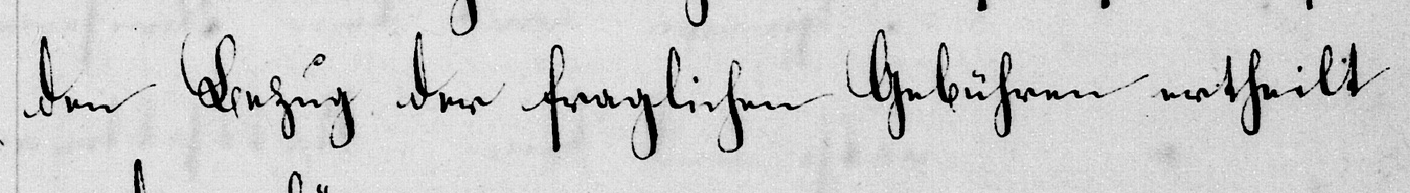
den Bezug der fraglichen Gebühren ertheilt
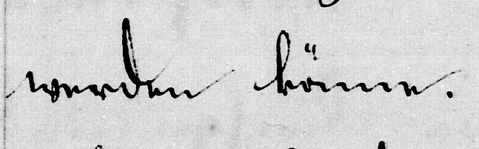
werden könne.
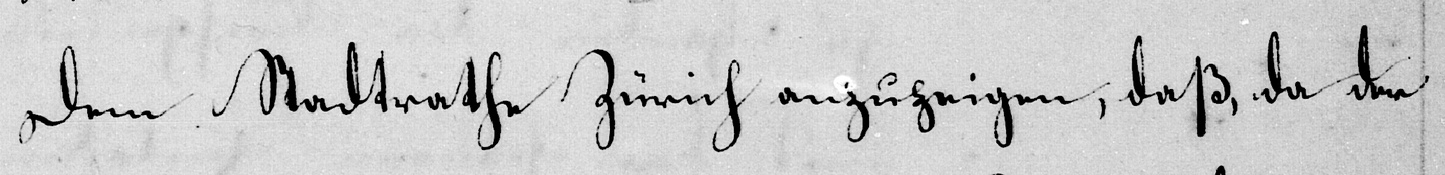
Dem Stadtrathe Zürich anzuzeigen, daß, da der
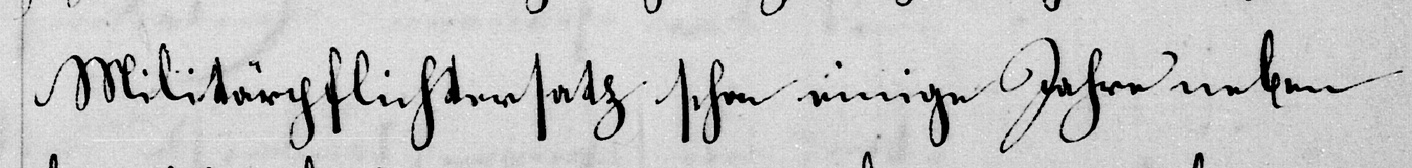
Militärpflichtersatz schon einige Jahre neben
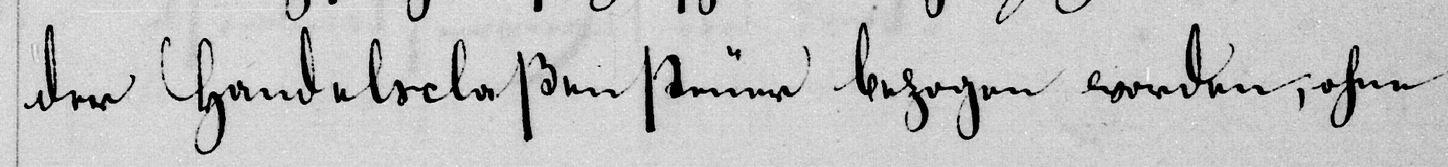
der Handelsclaßensteuer bezogen worden, ohne
